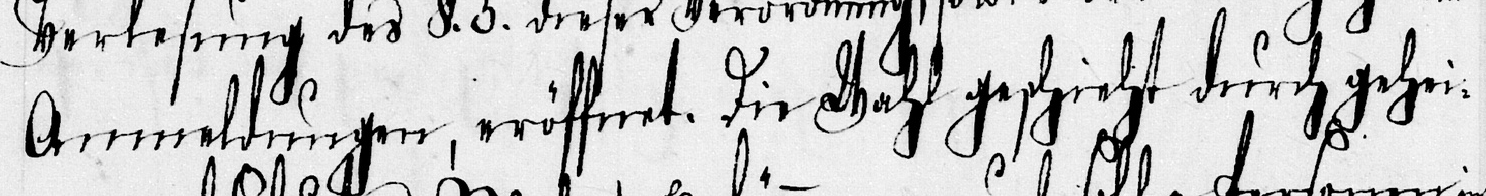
Anmeldungen, eröffnet. Die Wahl geschieht durch gehei¬
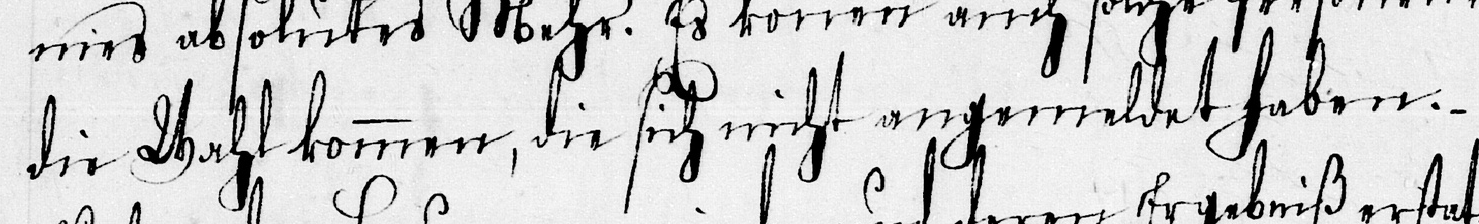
die Wahl kommen, die sich nicht angemeldet haben.
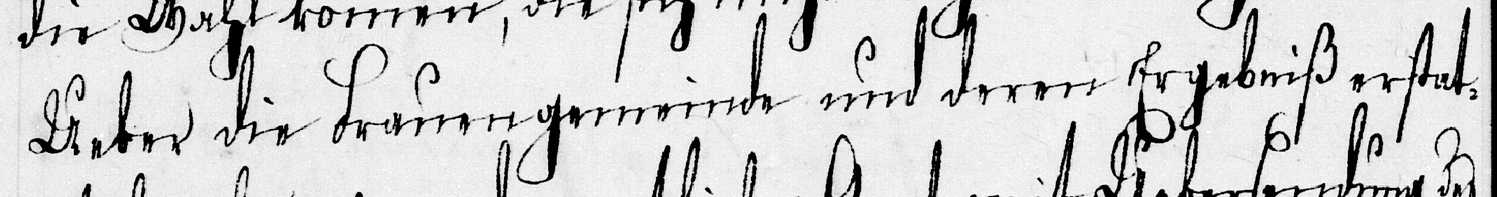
Ueber die Frauengemeinde und deren Ergebniß erstat¬
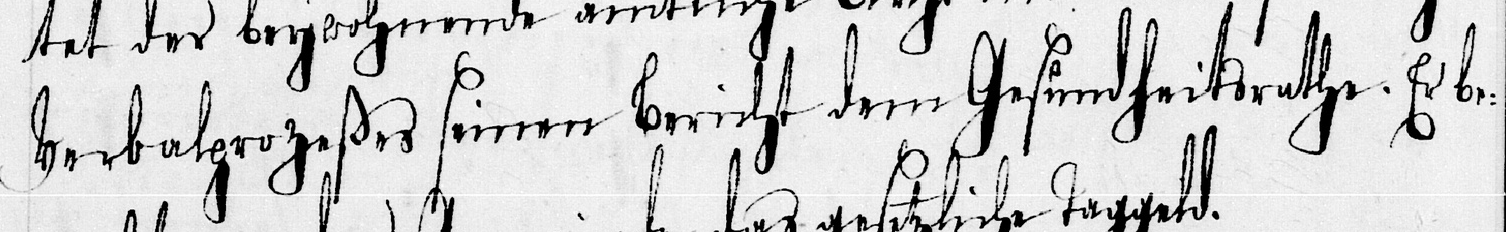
Verbalprozeßes seinen Bericht dem Gesundheitsrathe. Er b¬
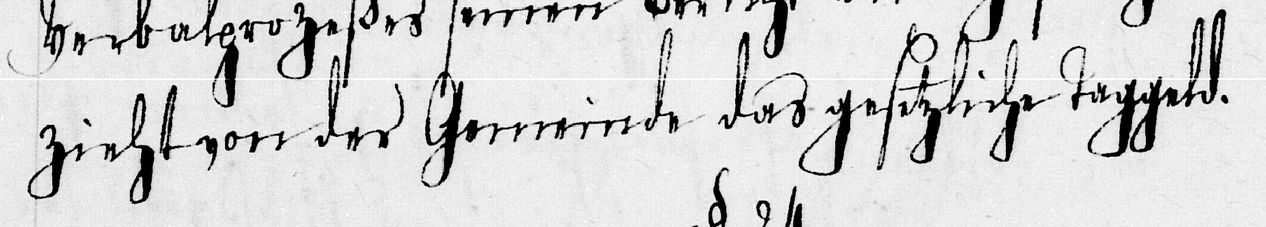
ezieht von der Gemeinde das gesetzliche Tagge¬
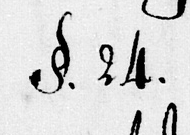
§. 24.
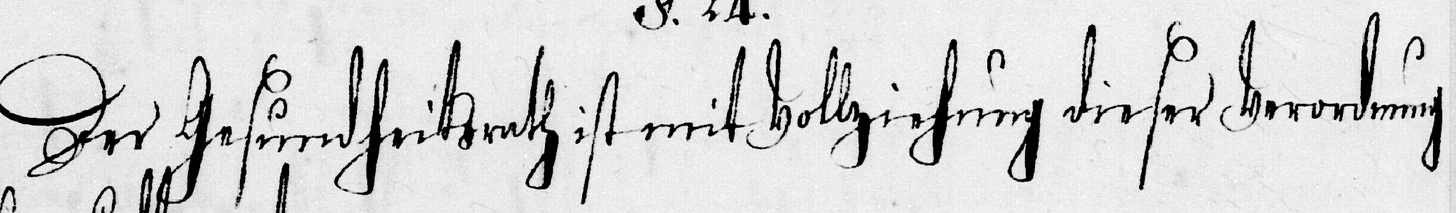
Der Gesundheitsrath ist mit Vollziehung dieser
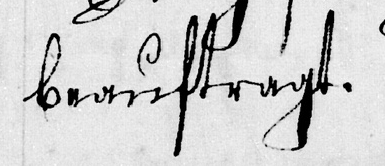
beauftragt.
